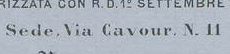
Sede, Via Cavour, N. 11
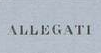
22 Novembre 1871
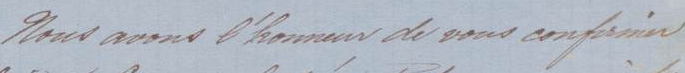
Nous avons l'honneur de vous confirmer
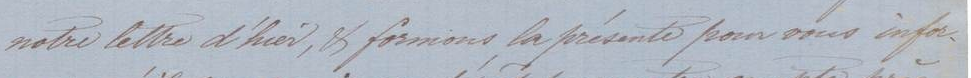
notre lettre d'hier, & formons la présente pour vous infor-
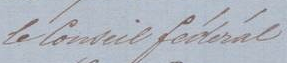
le Conseil fédéral
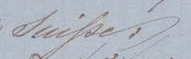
suisse:
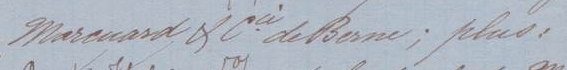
Marcuard & Cie de Berne; plus:
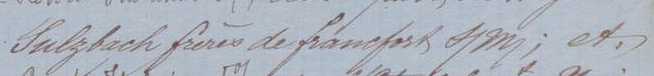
Sulzbach frères de Francfort s/M; et:
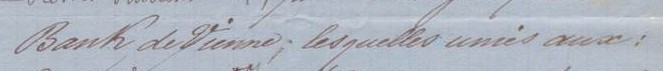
Bank de Vienne; lesquelles unies aux:
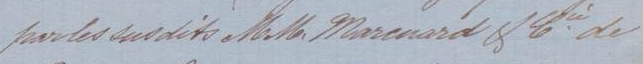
par les susdits MM. Marcuard & Cie de
